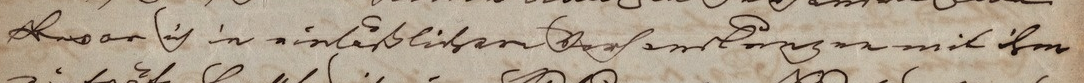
Bevor ich in einläßlichere Verhandlungen mit ihm
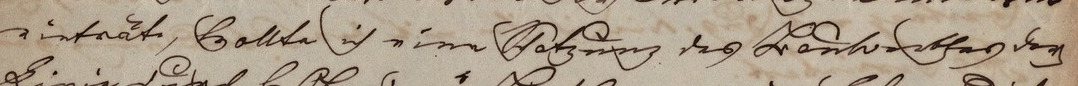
einträte, wollte ich eine Schatzung des Bauwerthes der
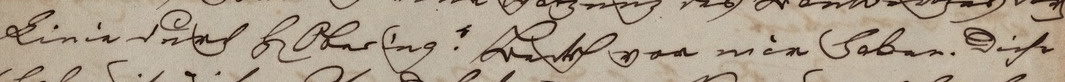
Linie durch H. OberingrBeckh vor mir haben. Diese
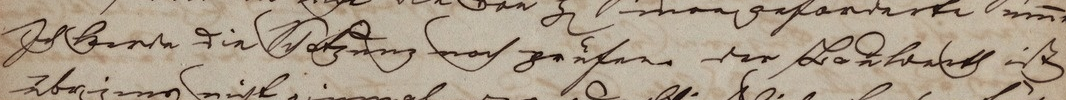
Ich werde die Schatzung noch prüfen. Der Bauwerth ist
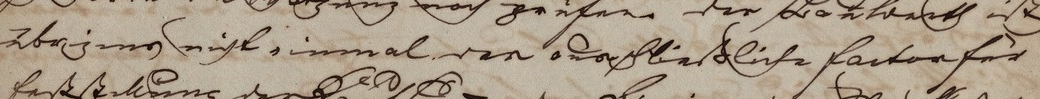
übrigens nicht einmal der ausschließliche Factor für
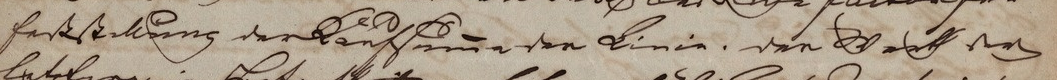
Feststellung der Kaufsumme der Linie. Der Werth der
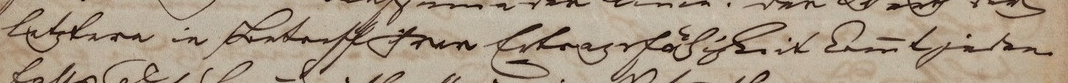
letztern in Betreff ihrer Ertragsfähigkeit kommt jeden-
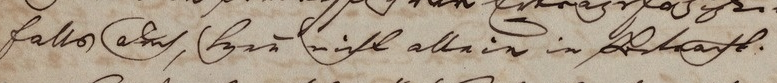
falls auch, wenn nicht allein in Betracht.
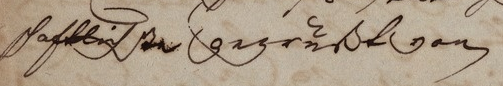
schaftlichste gegrüßt von
